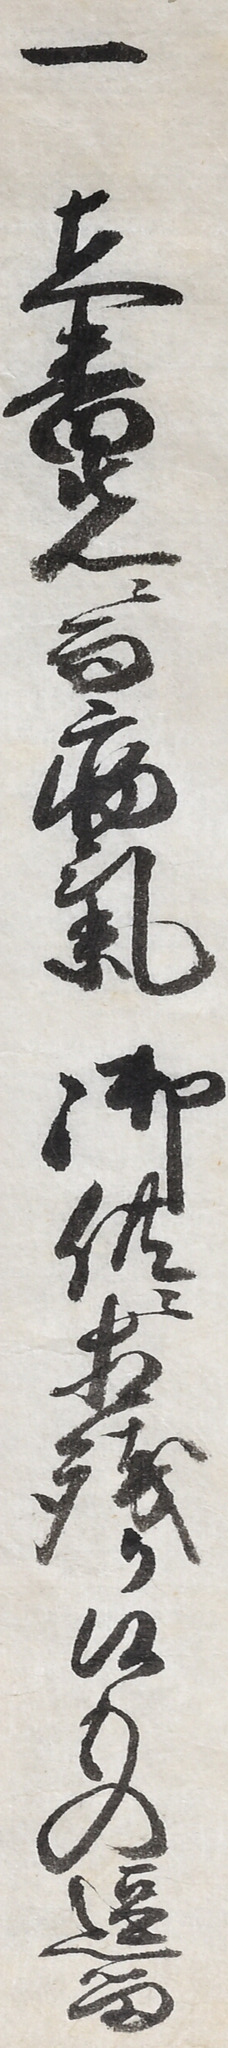一在番先ニ而病気御供ニ相残リ候もの逗留
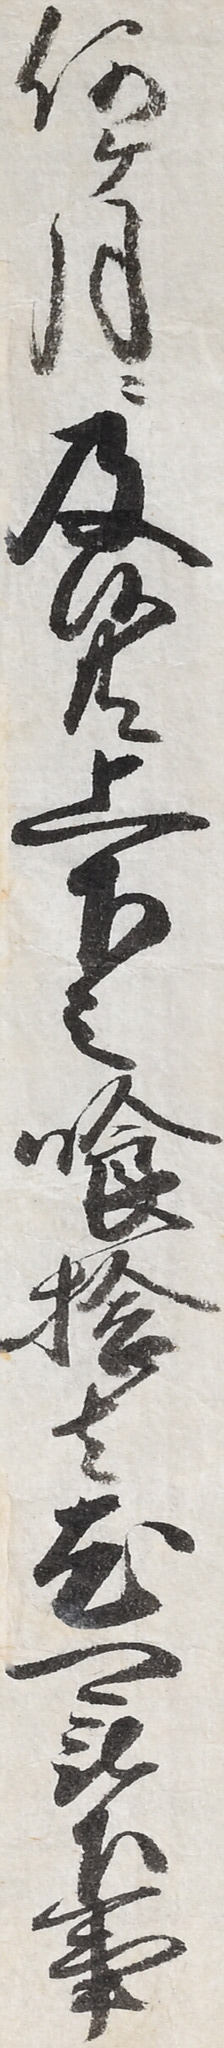何ヶ月ニ及候共上下之喰捨は尤可被下事
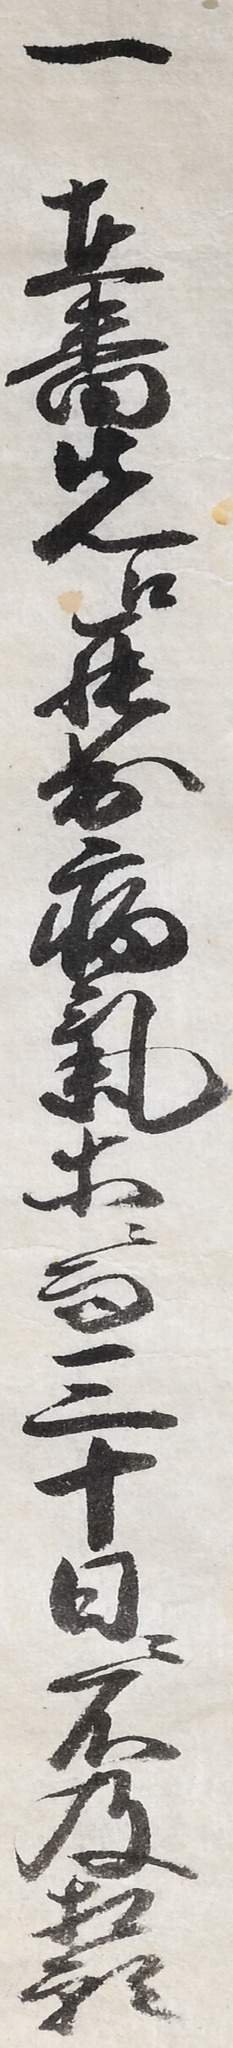一在番先江罷出病気等ニ而三十日ニ不及相願
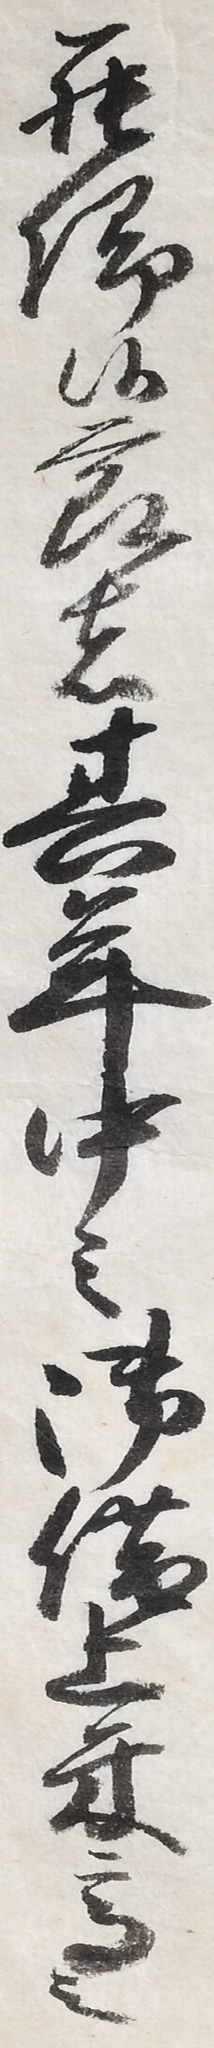罷帰候節は其年中之御借上米高之
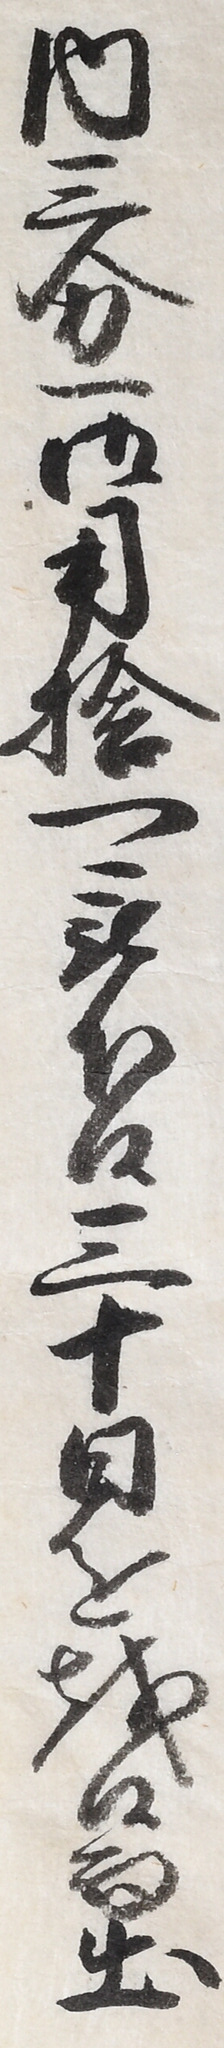内三分一御用捨可被下候三十日を越候而出
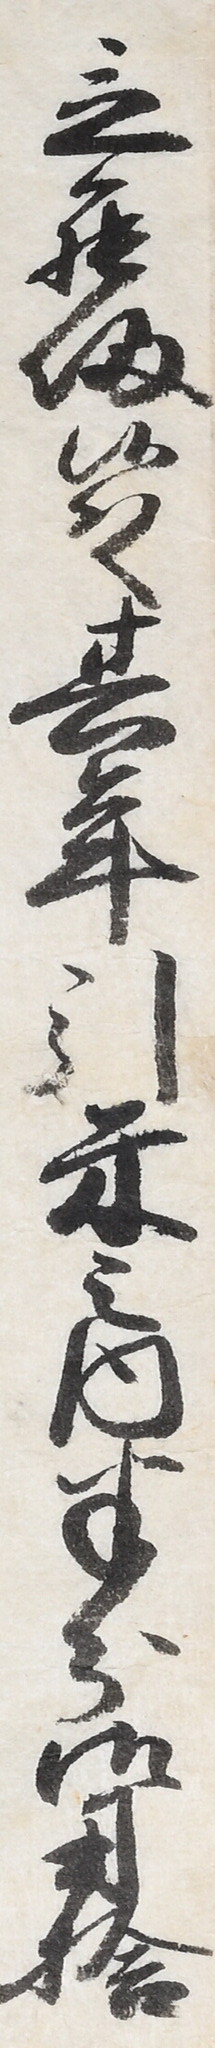立罷帰候ハヽ其年引米之内半分御用捨
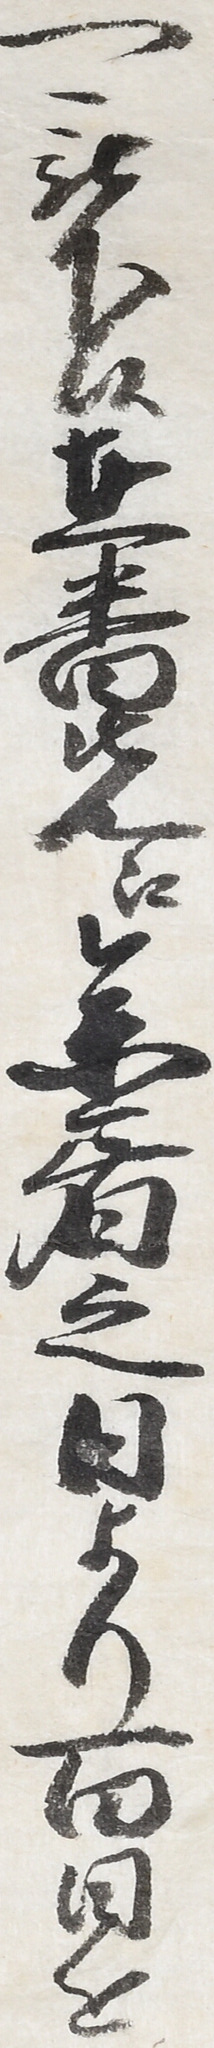可被下候在番先江参着之日より百日を
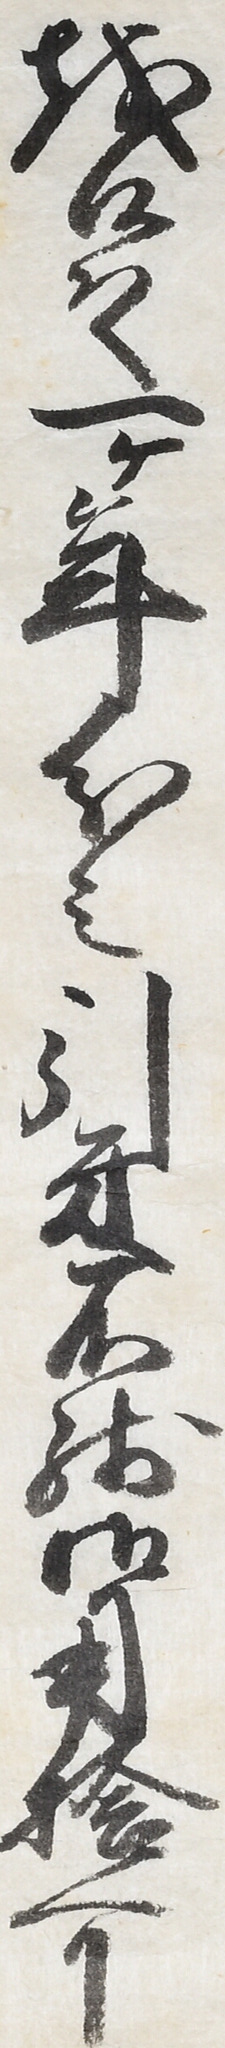越候ハヽ一ヶ年分之引米不残御用捨可
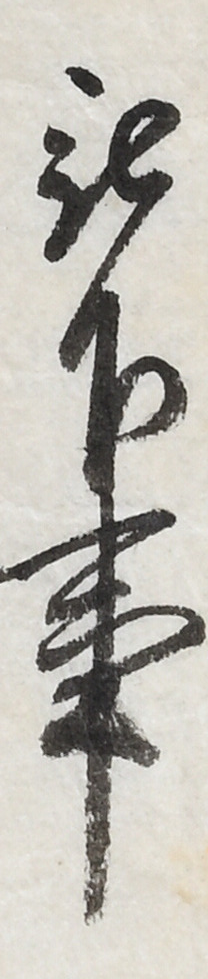被下事
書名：御給分渡り方定追加
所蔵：伊那市立高遠町図書館・合同会社AMANE
